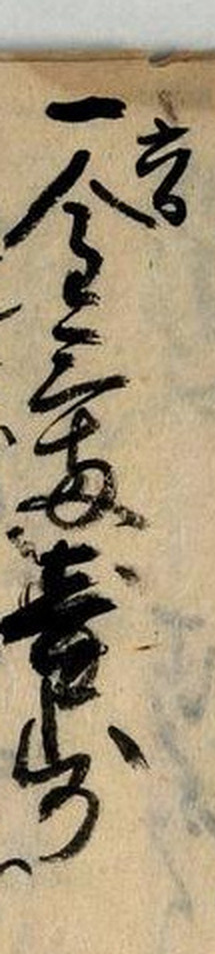一金三両壱歩
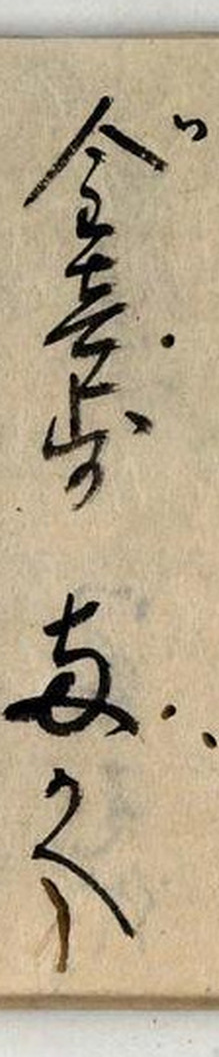金壱歩両かへ
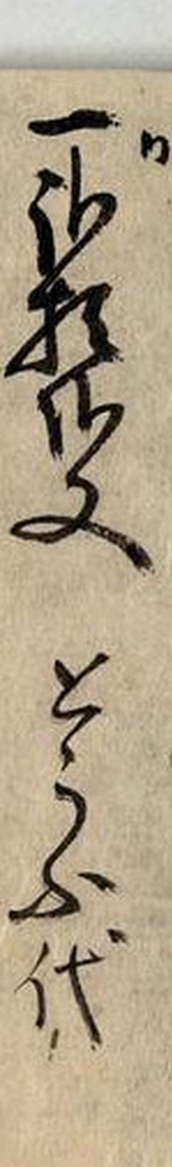一弐拾弐文とうふ代
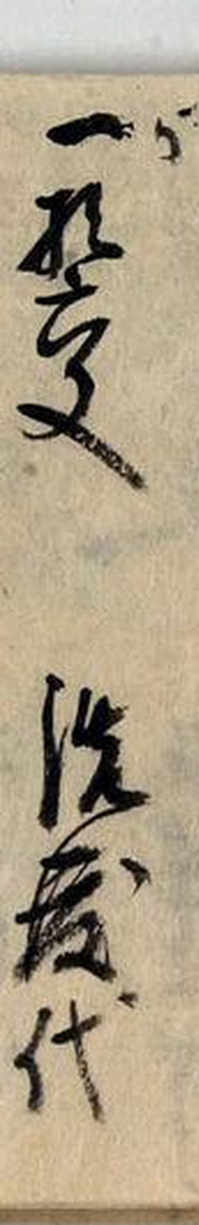一拾六文洗度代

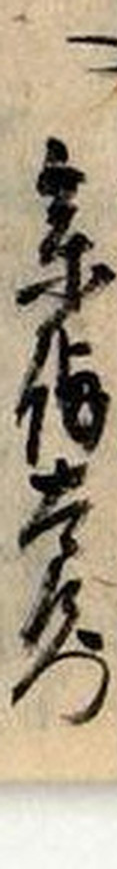参詣太左衛門
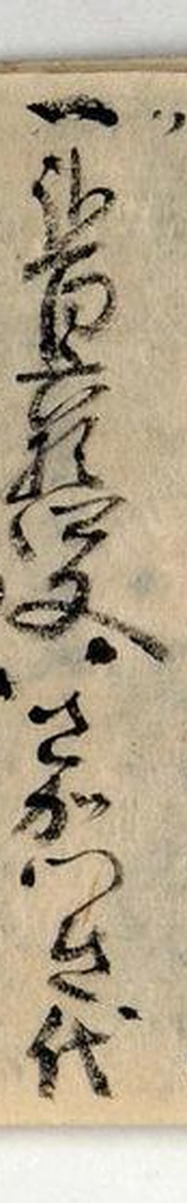一弐百六拾四文さかつき代
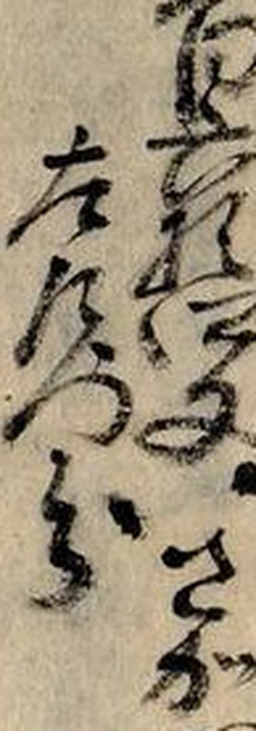太左衛門分
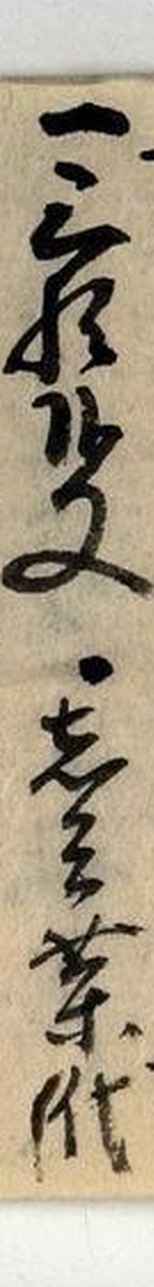一三拾弐文しみ薬代
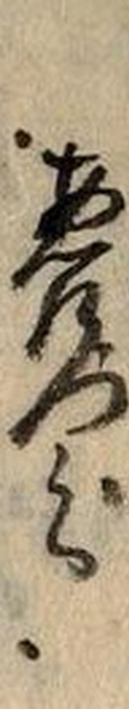惣左衛門分
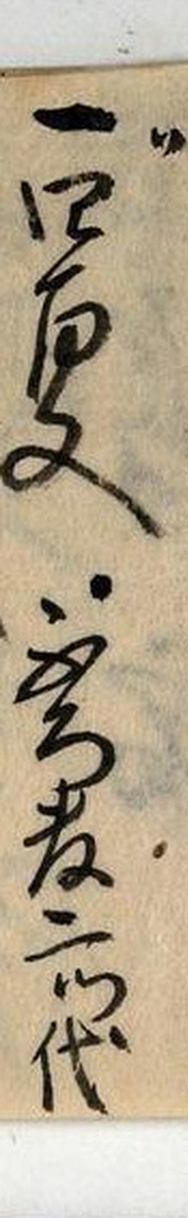一四百文ふろ敷二つ代
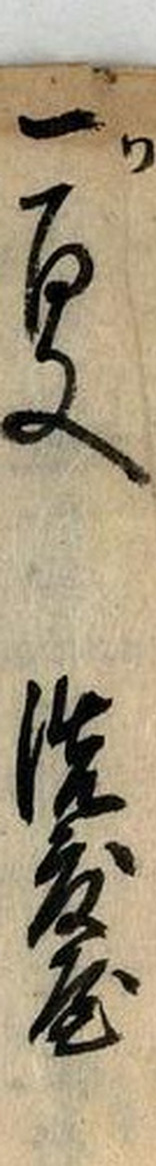一百文洗度屋
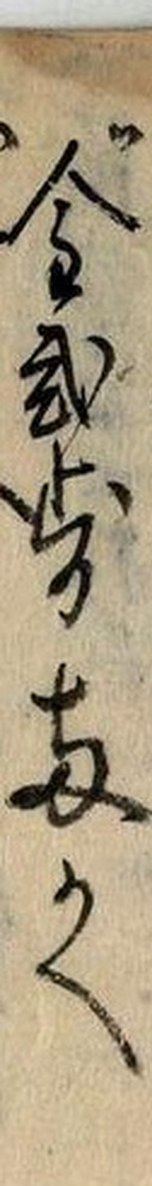金弐歩両かへ
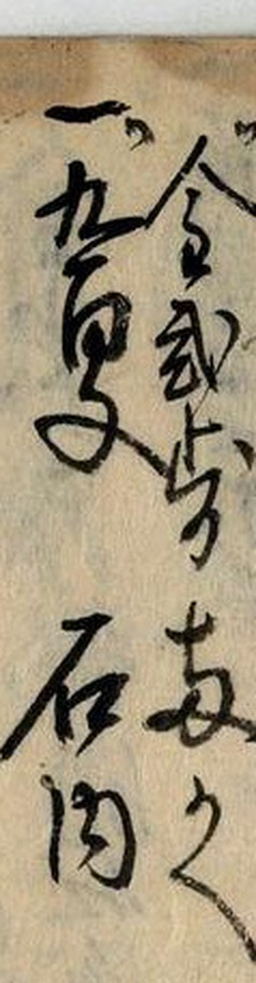一九百文石内
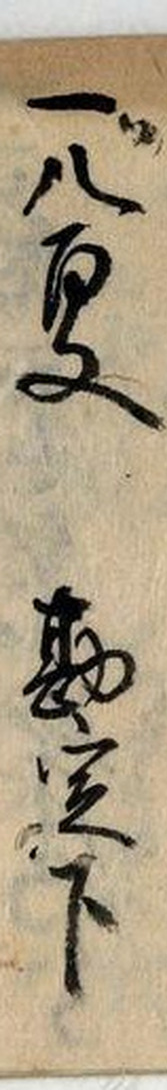一八百文勘定下
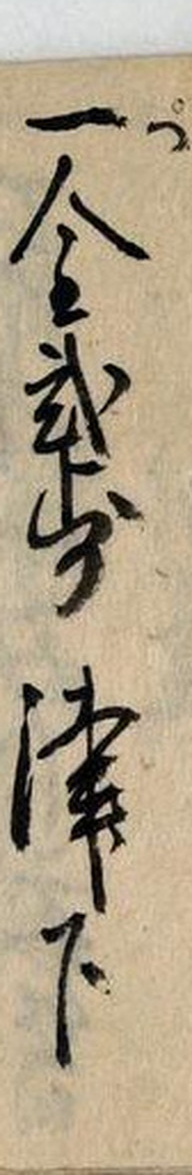一金弐歩津下
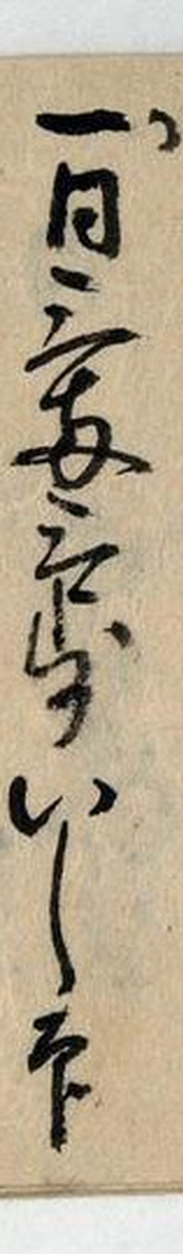一同三両三歩いし印
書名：道中小遣留帳（旅）
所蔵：福井県文書館 Fukui Prefectural Archives
